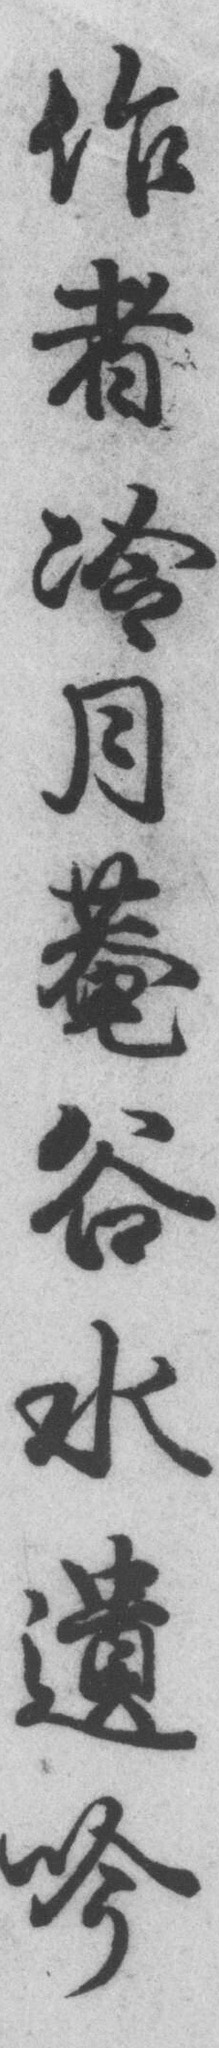作者冷月菴谷水遺吟
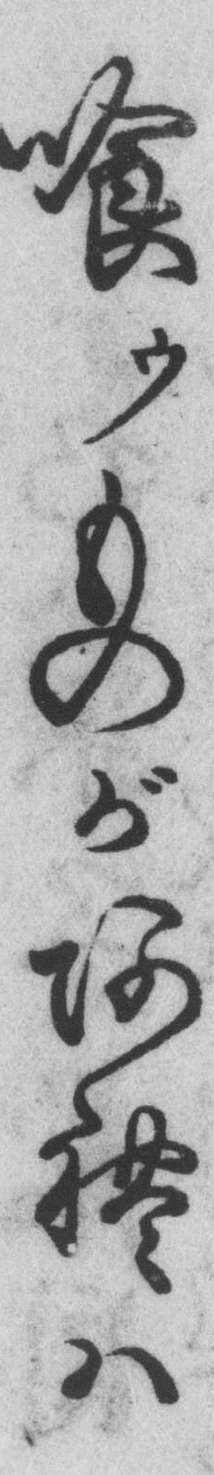喰ウものが阿禮は
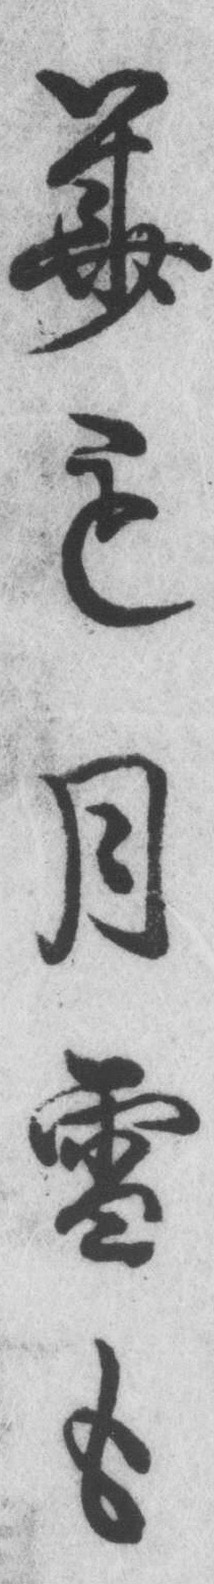夏も月雪も
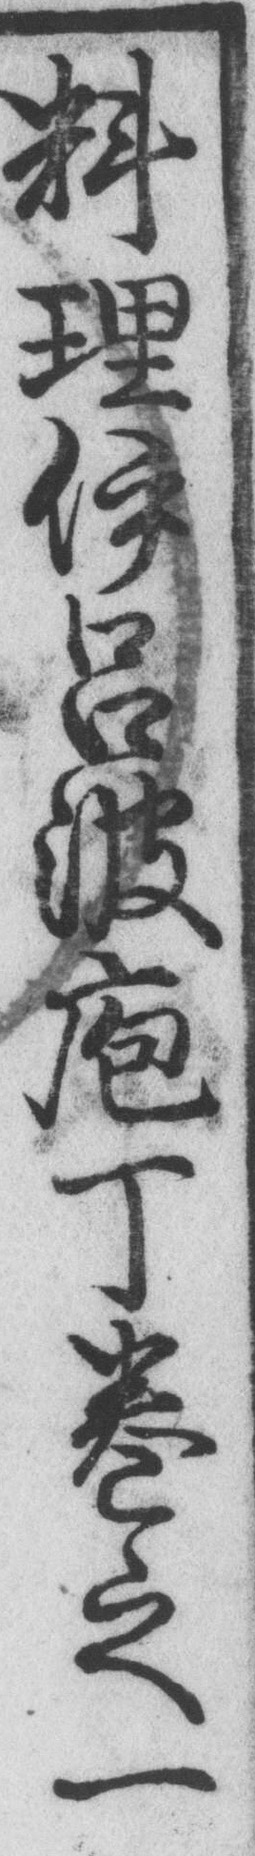料理伊呂波庖丁巻之一
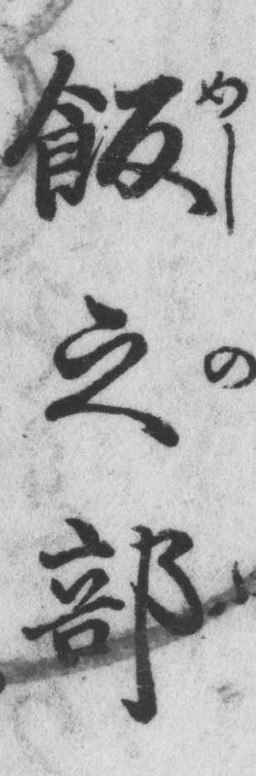飯之部
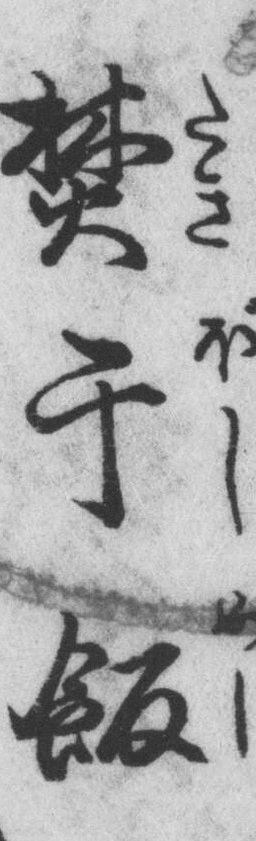焚干飯
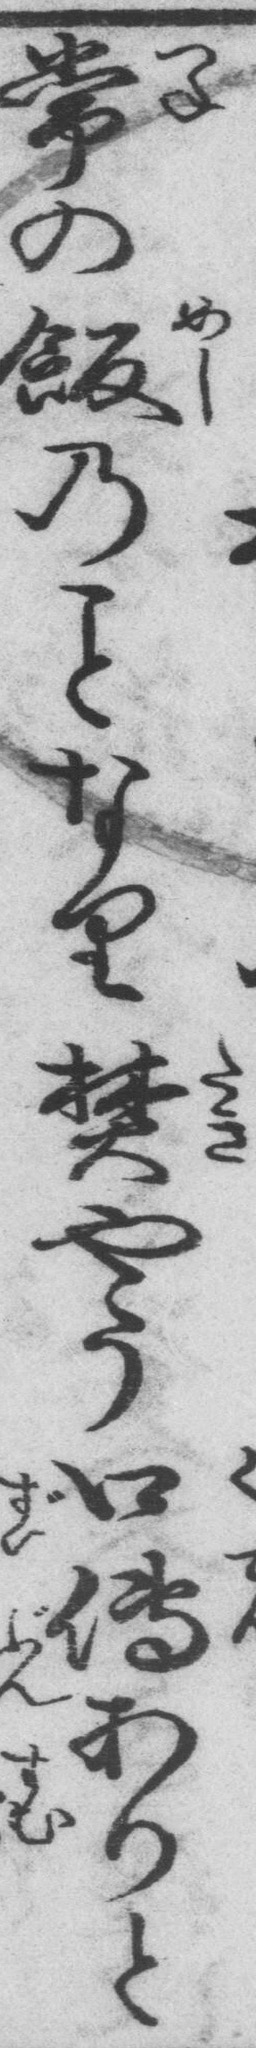常の飯乃ことな里焚やう口傳ありと
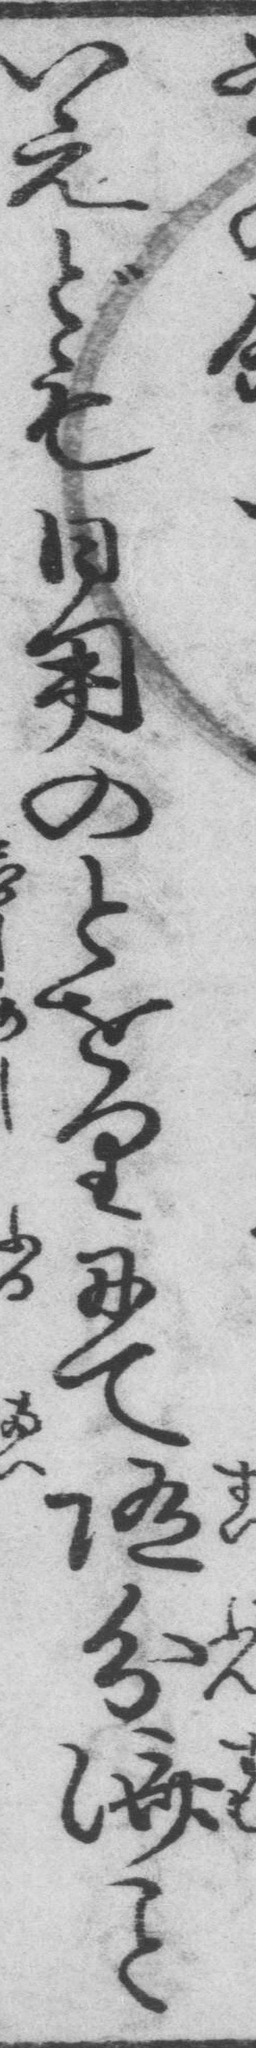いえとも日用のとを里丹て随分濟こと
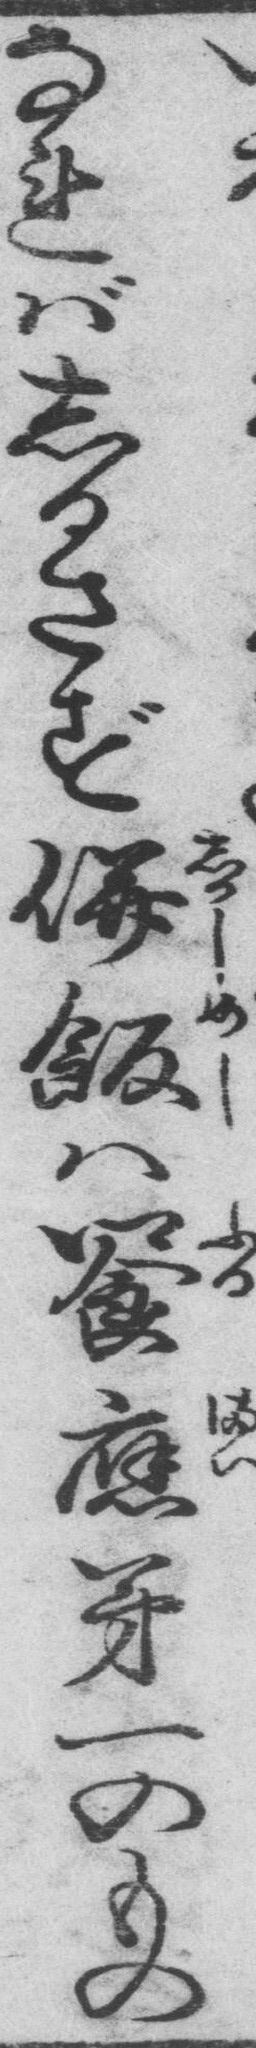な連ば志るさず併飯は饗應第一のもの
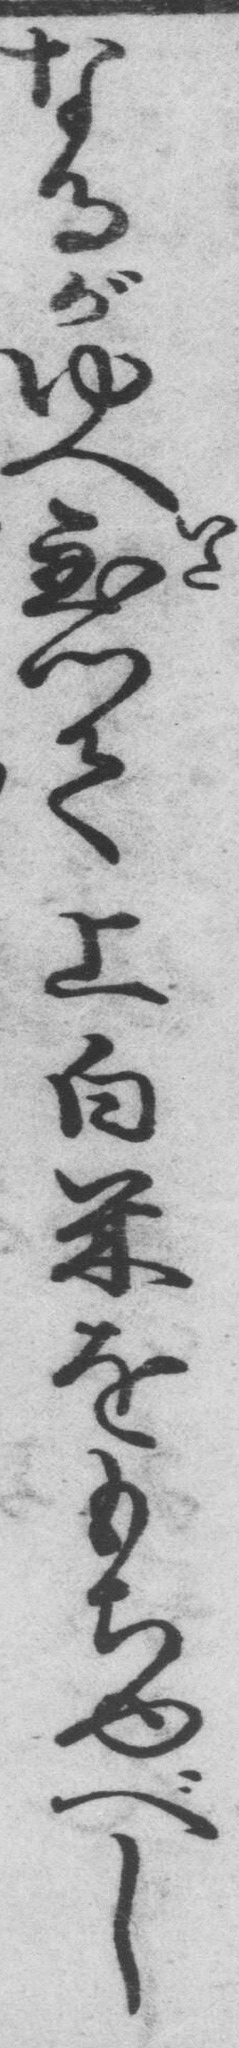なるがゆへ至つて上白米をもちゆべし
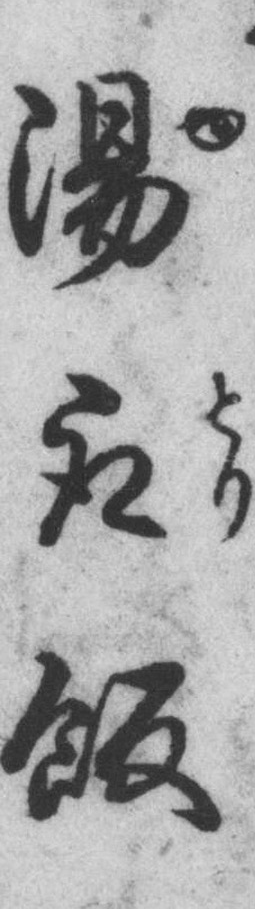湯取飯

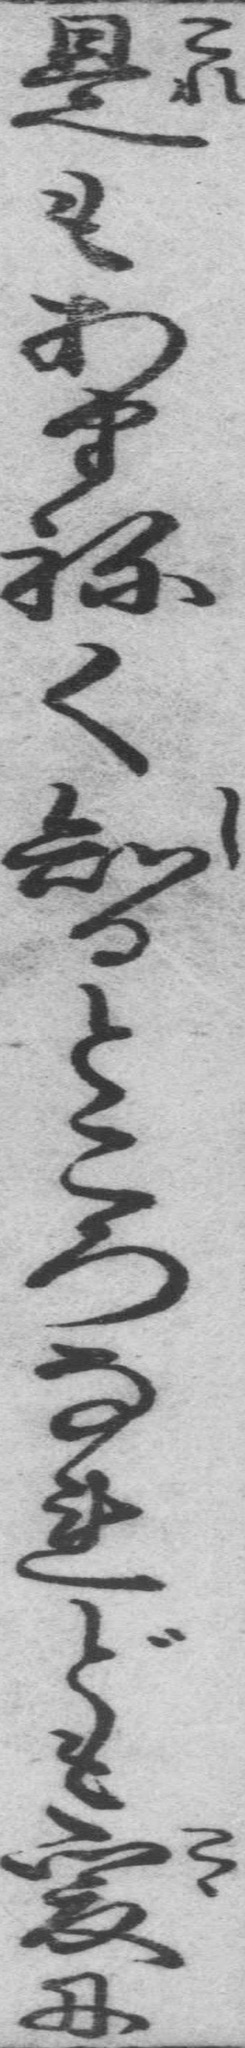是もあま祢く知るところな連ども爰丹
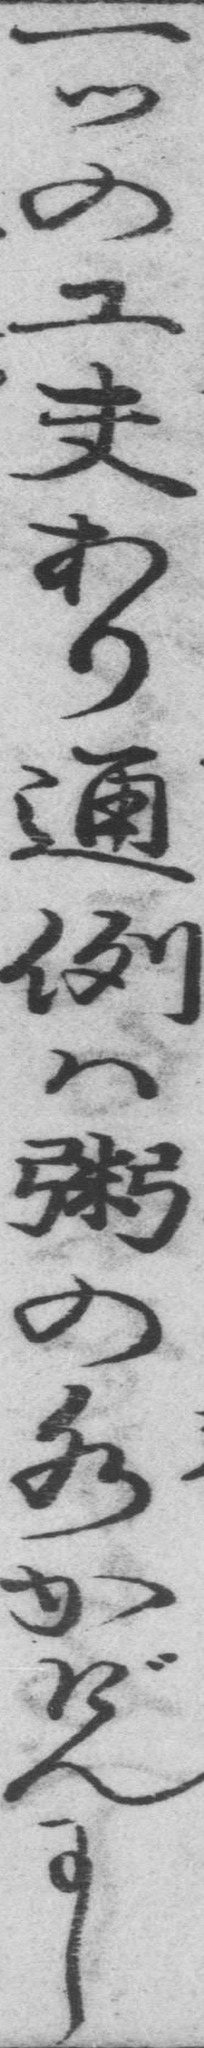一ツの工夫あり通例は粥の水かげん尓し
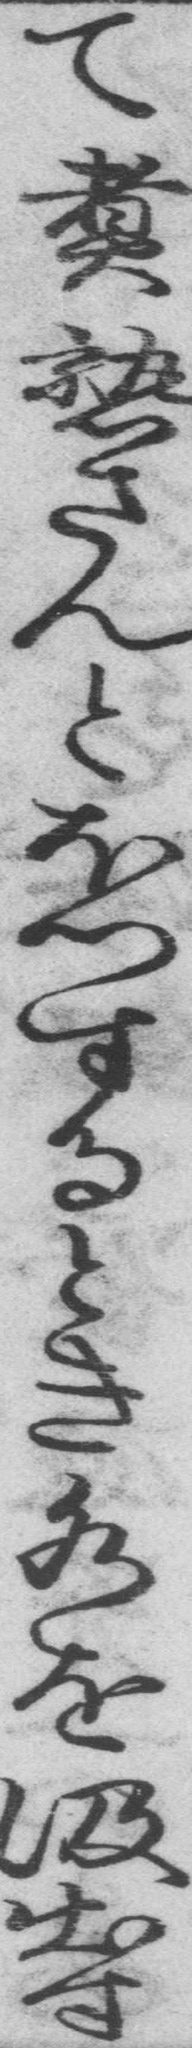て煮熟さんと不つするとき水を汲出す
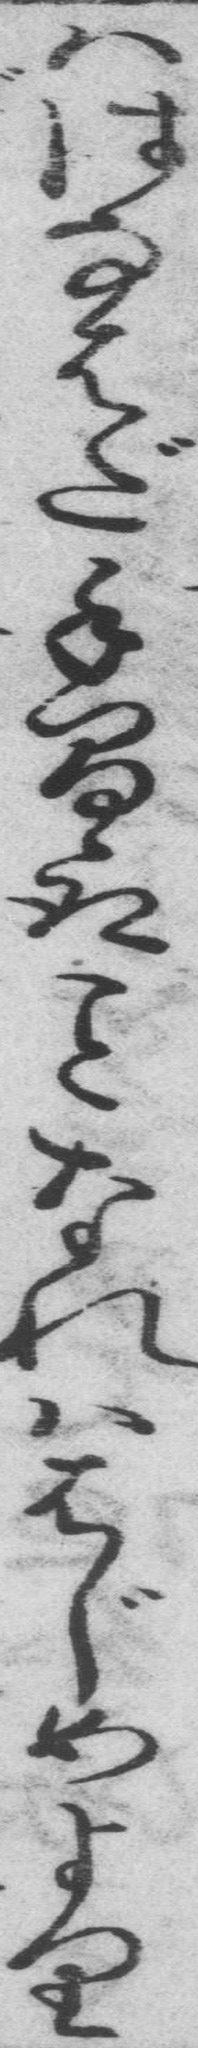ははなはだ手間取ことなれははじめよ里
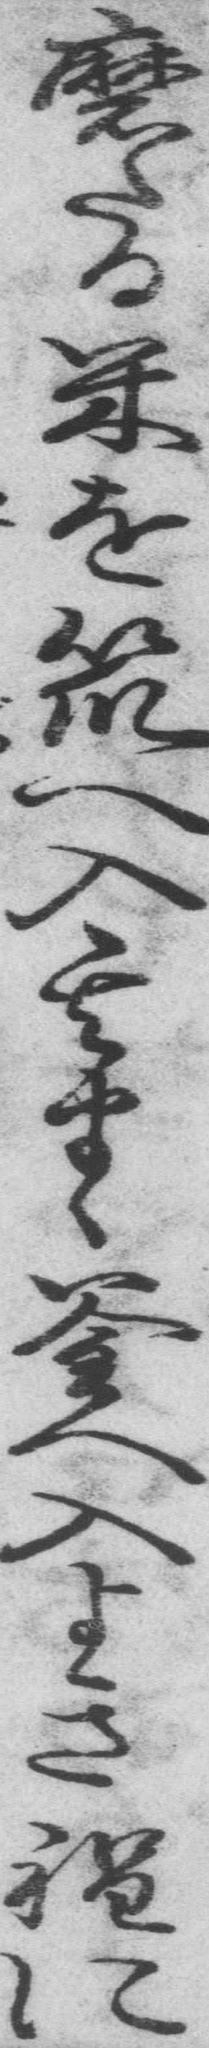磨たる米を笊へ入其まゝ釜へ入よき程に
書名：料理伊呂波庖丁
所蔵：大阪府立大学学術情報センター 国文学研究資料館
